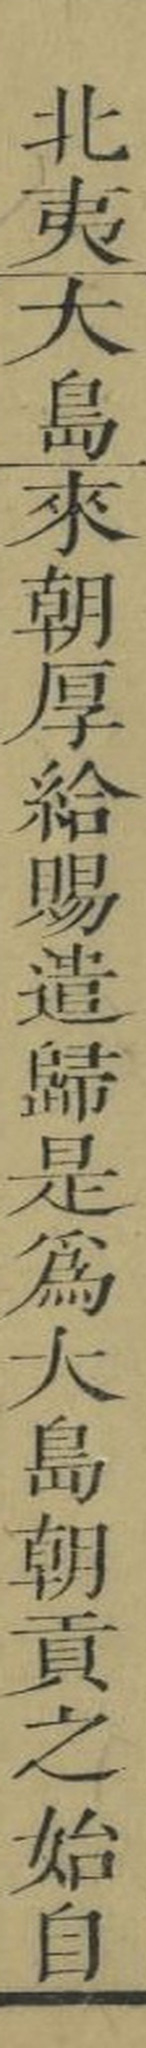北夷[大島]来朝厚給賜遣帰是為大島朝貢之始自
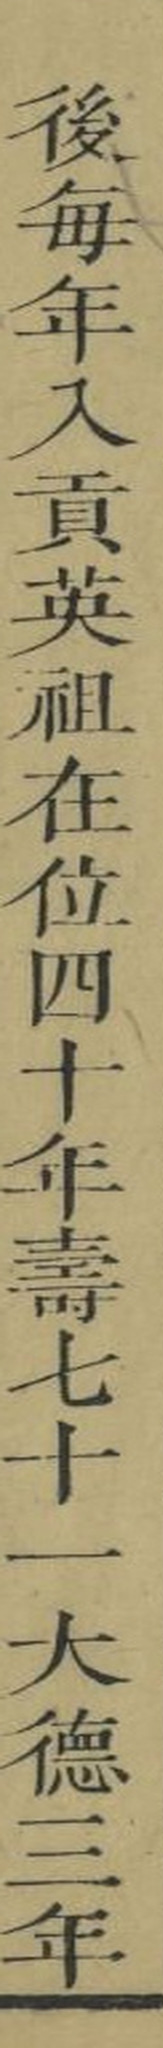後毎年入貢英祖在位四十年寿七十一大徳三年
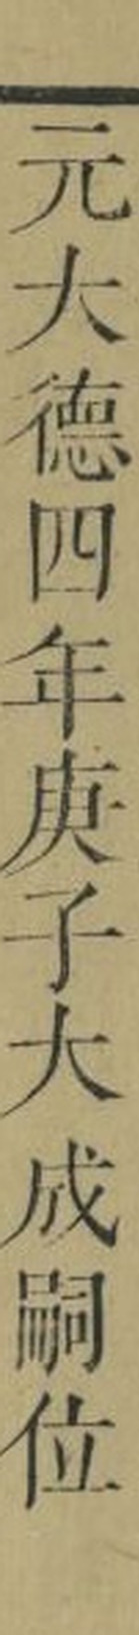元大徳四年庚子大成嗣位
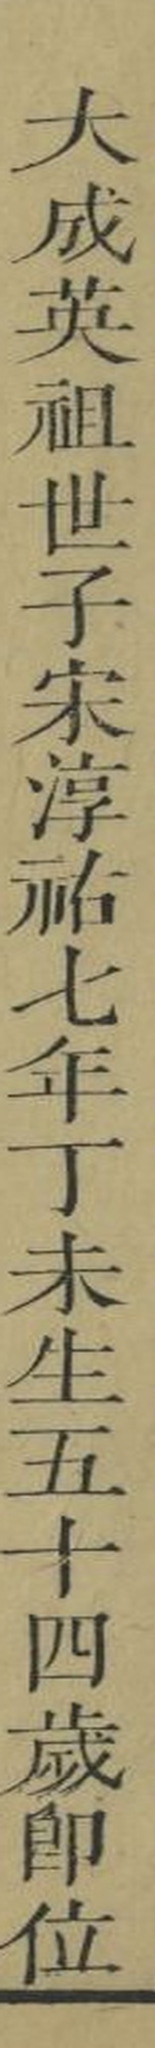大成英祖世子宋淳祐七年丁未生五十四歳即位
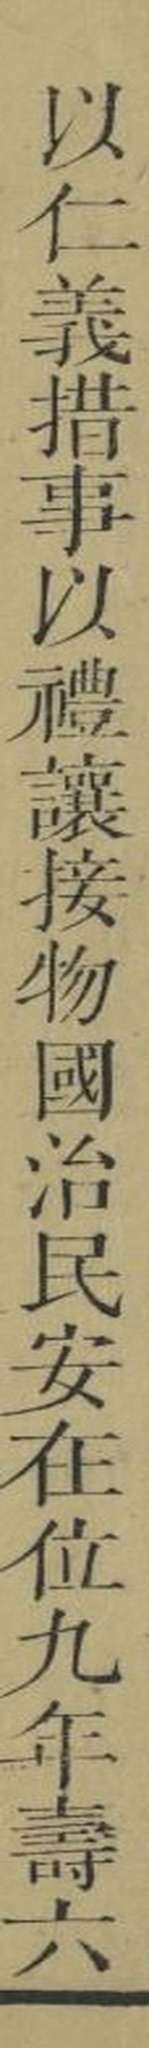以仁義措事以礼譲接物国治民安在位九年寿六
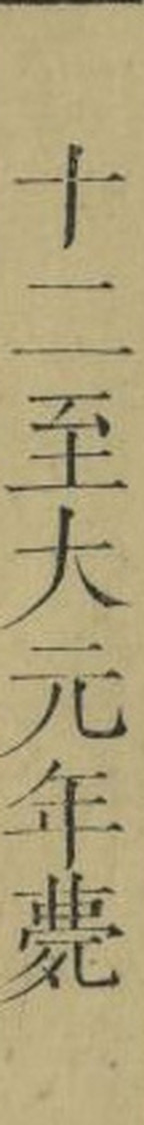十二年至大元年薨
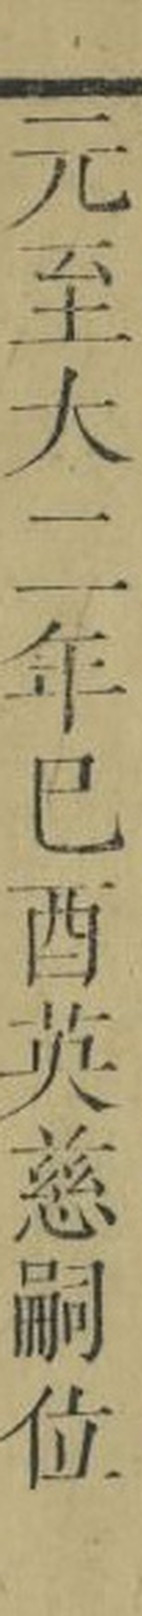元至大二年巳酉英慈嗣位
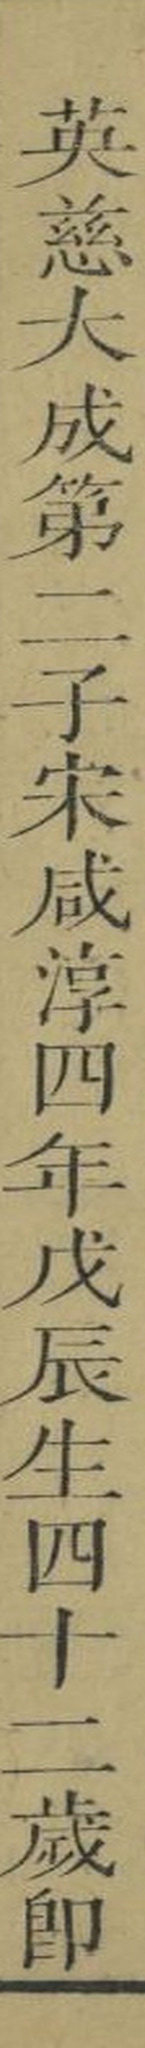英慈大成第二子宋咸淳四年戊辰生四十二歳即
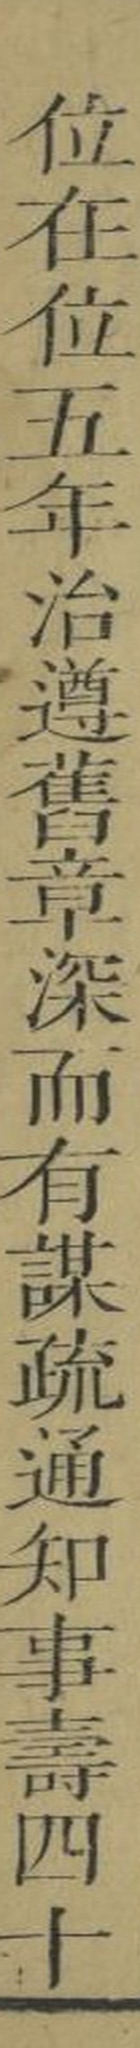位在位五年治遵旧章深而有謀疏通知事寿四十

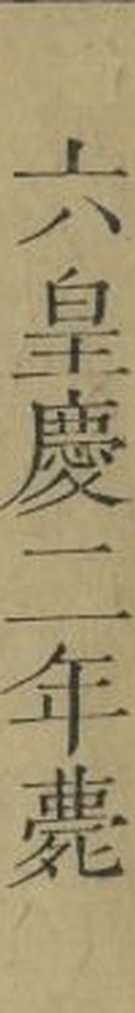六皇慶二年薨
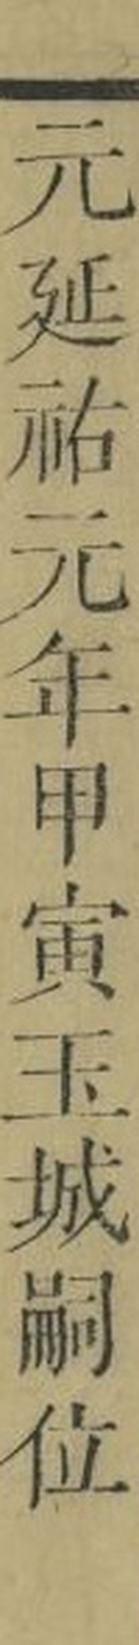元延祐元年甲寅玉城嗣位
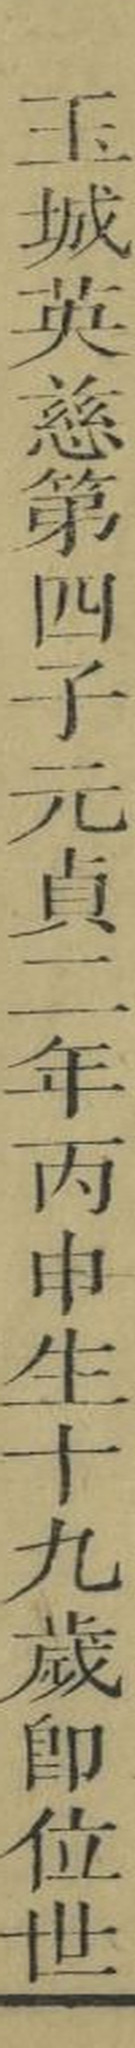玉城英慈第四子元貞二年丙申生十九歳即位世
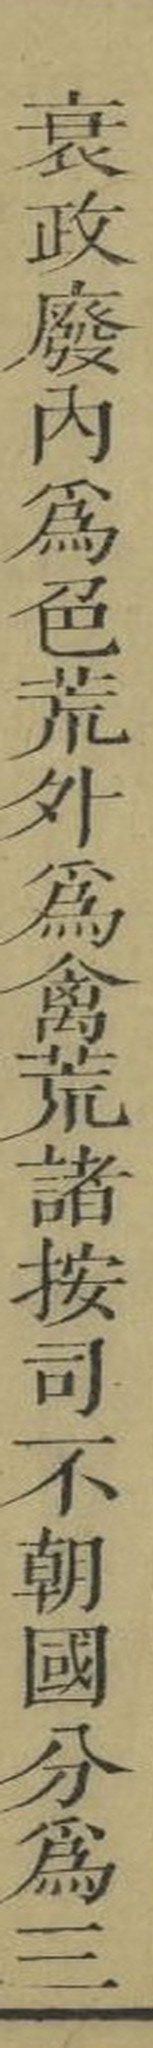衰政廃内為色荒外為禽荒諸按司不朝国分為三
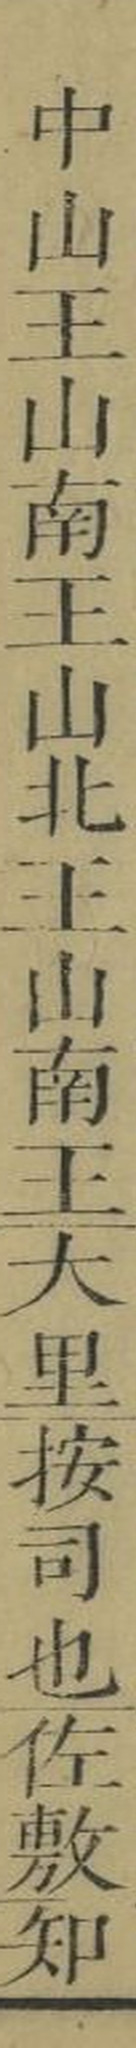中山王山南王山北王山南王[大里]按司也[佐敷][知
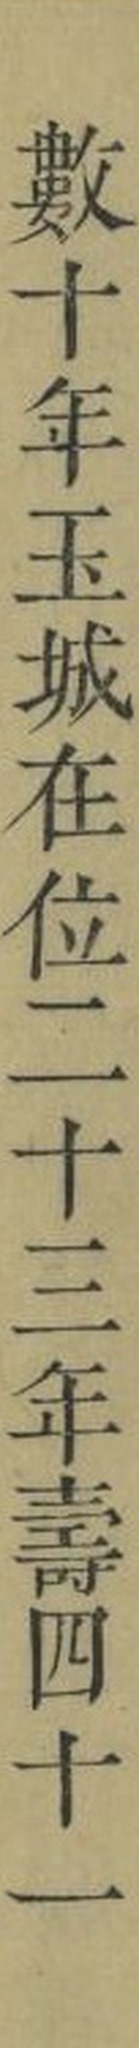数十年玉城在位二十三年寿四十一
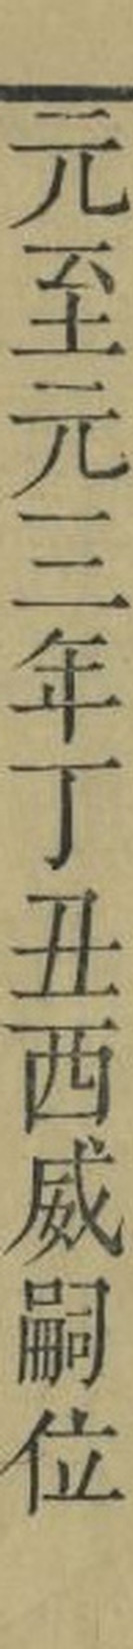元至元三年丁丑西威嗣位
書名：中山伝信録 巻三
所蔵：University of the Ryukyus Library
